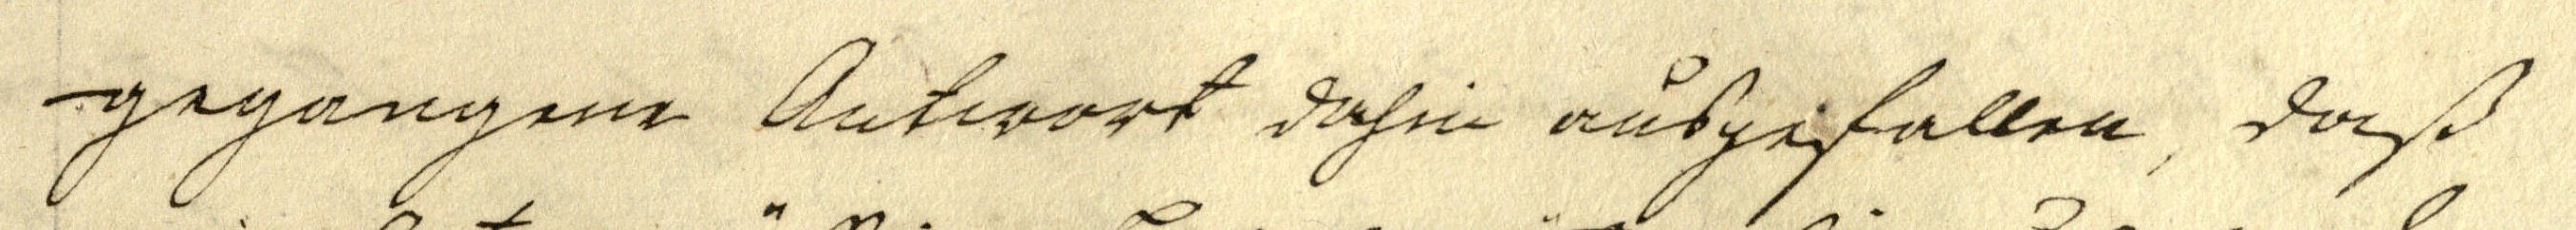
gegangene Antwort dahin ausgefallen, daß
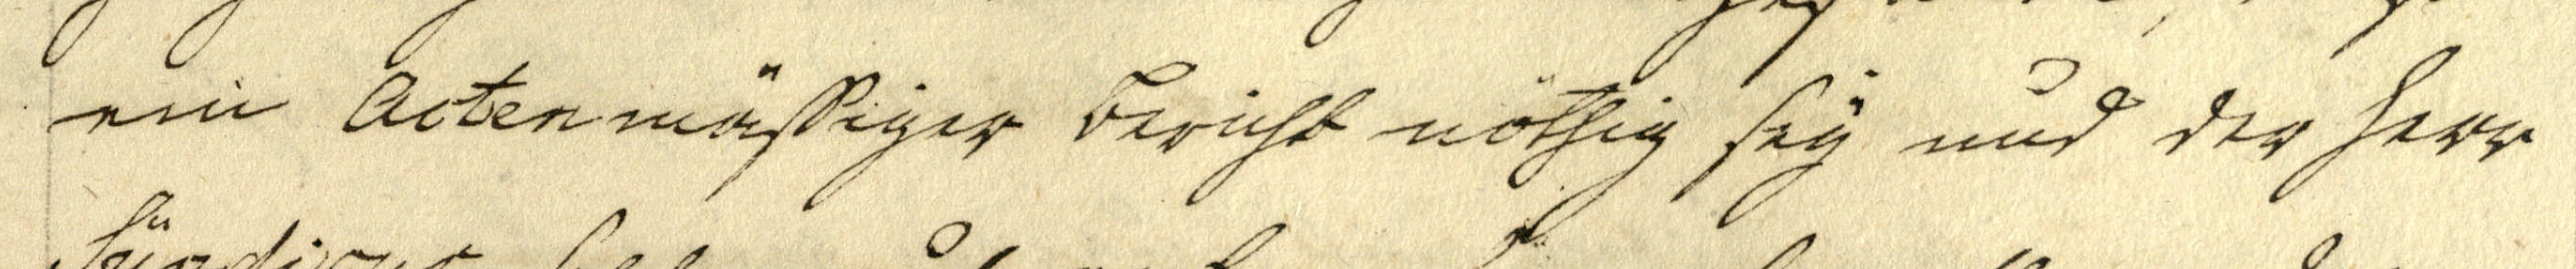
ein actenmässiger Bericht nöthig sey und der Herr
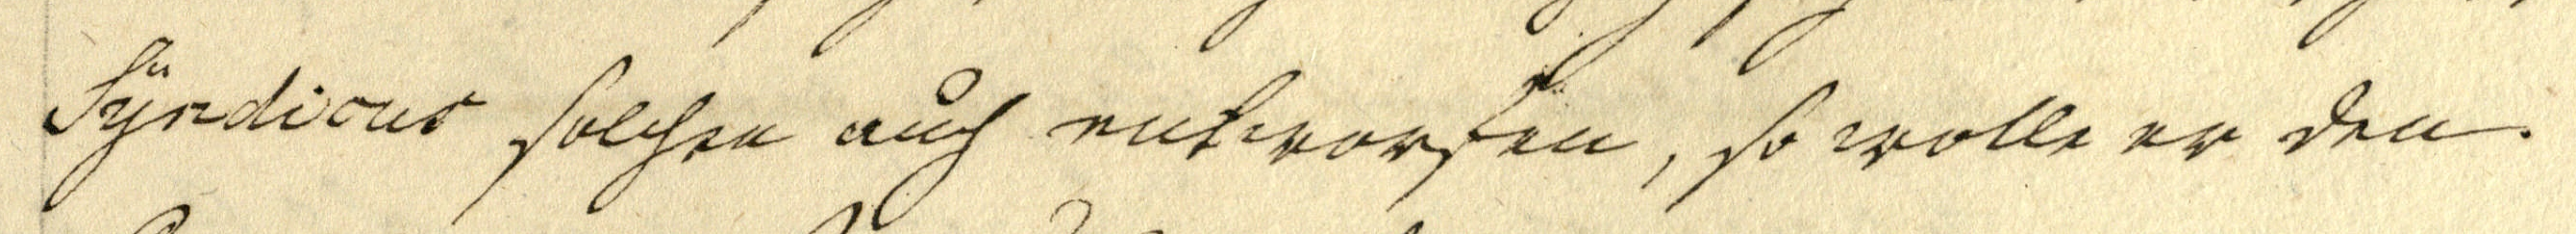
Syndicus solchen auch entworfen, so wolle er den-
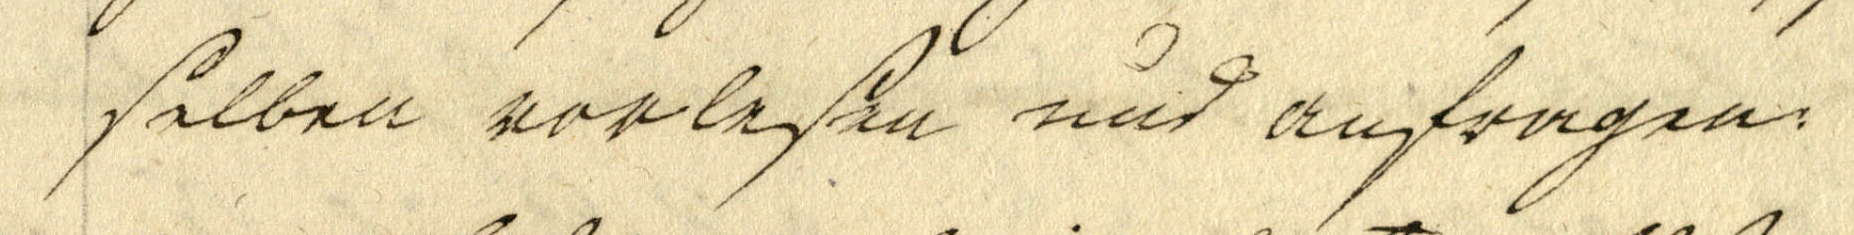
selben vorlesen und anfragen:
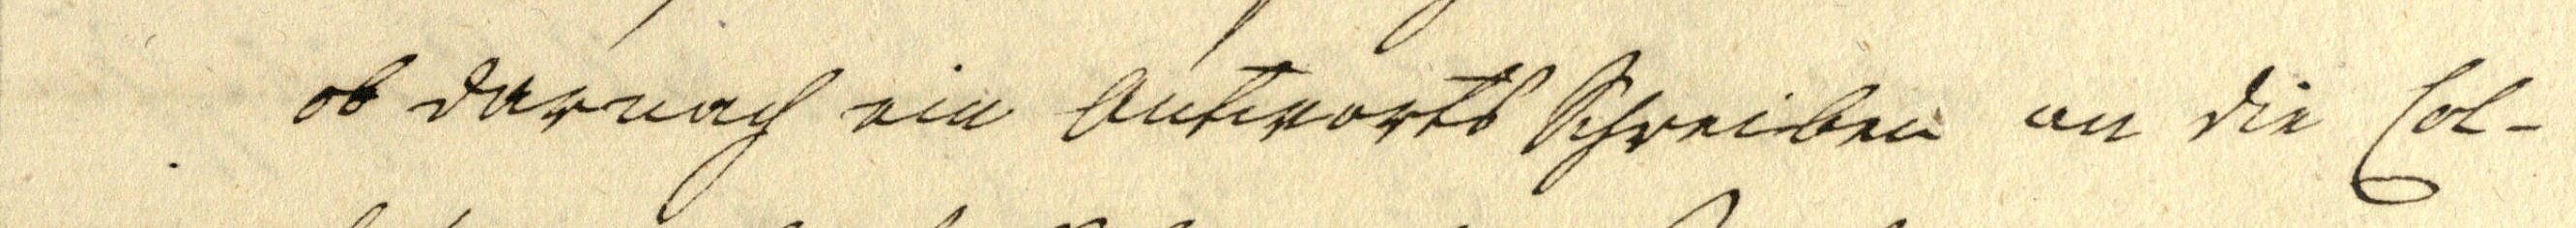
ob darnach ein Antworts Schreiben an die Col-
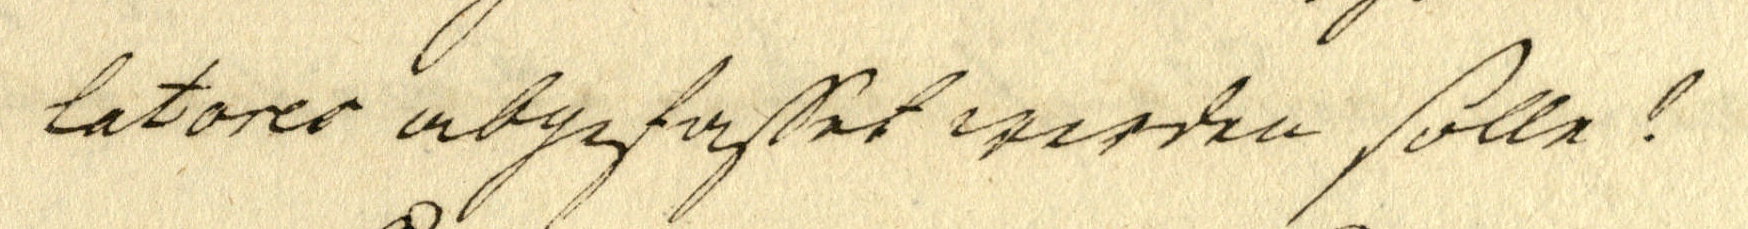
latores abgefasset werden solle?
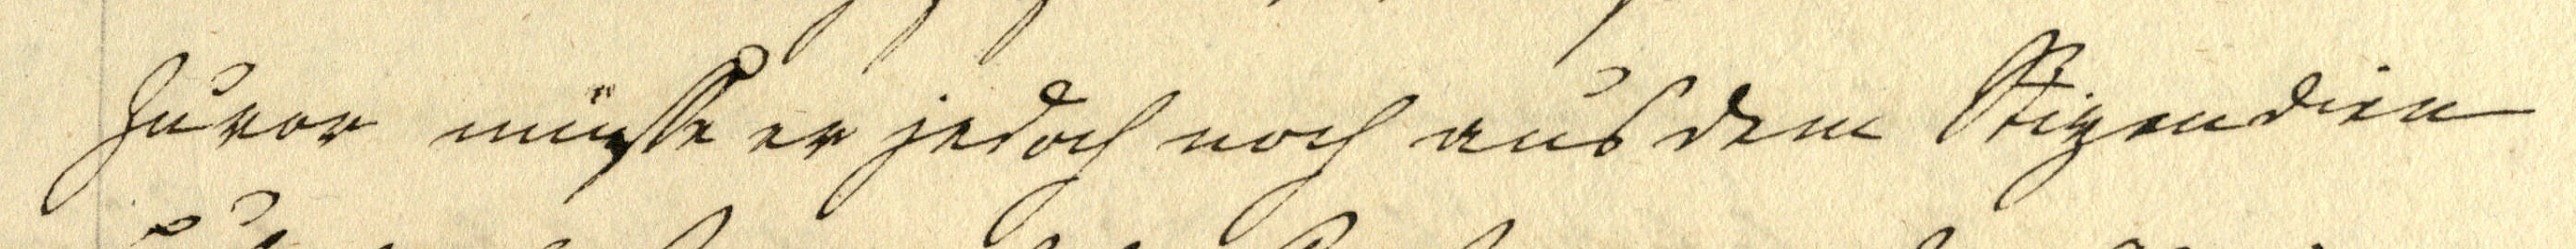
Zuvor müsse er jedoch noch aus dem Stipendien-
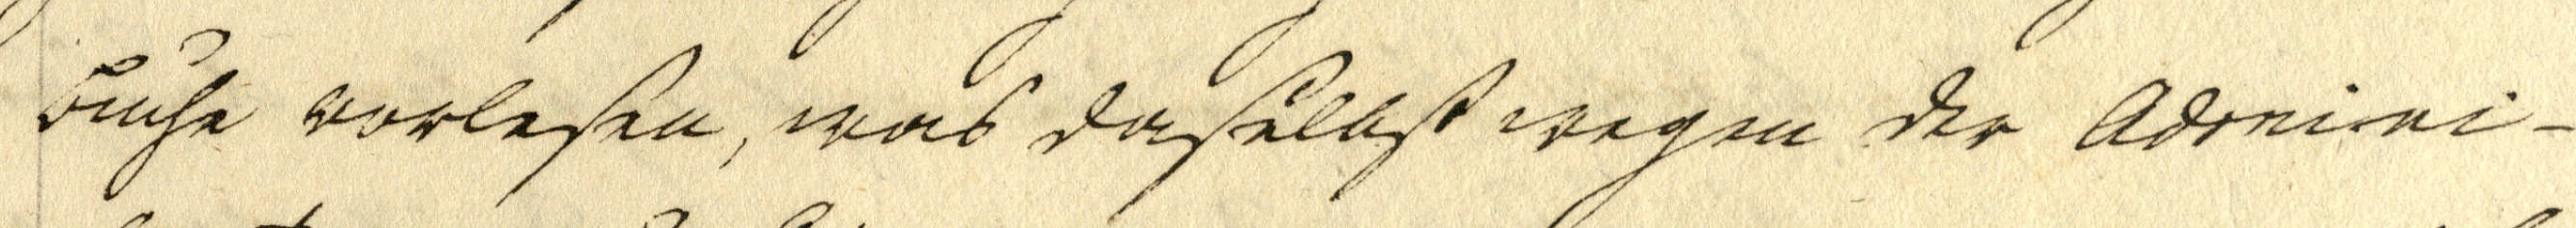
Buche vorlesen, was daselbst wegen der Admini-
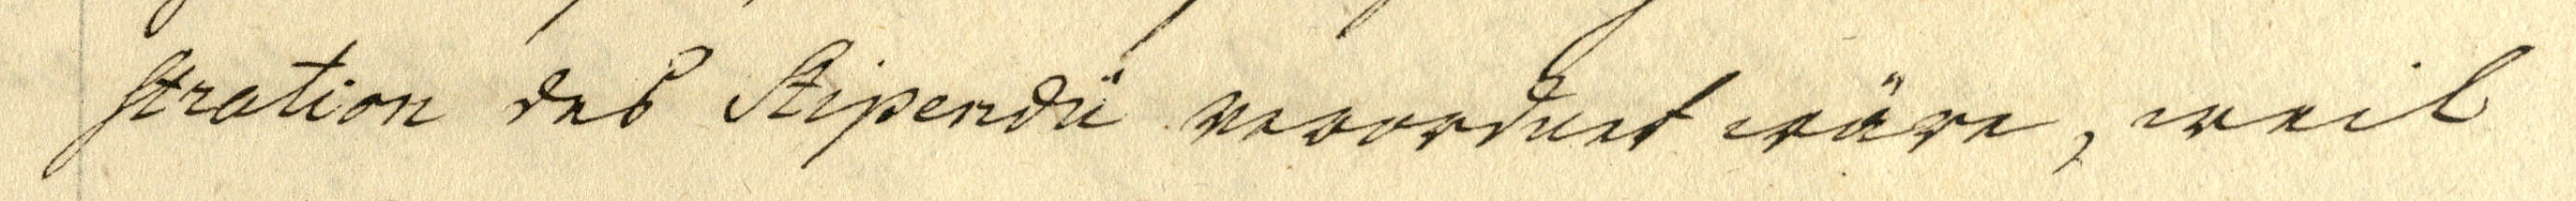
stration des Stipendii verordnet wäre, weil
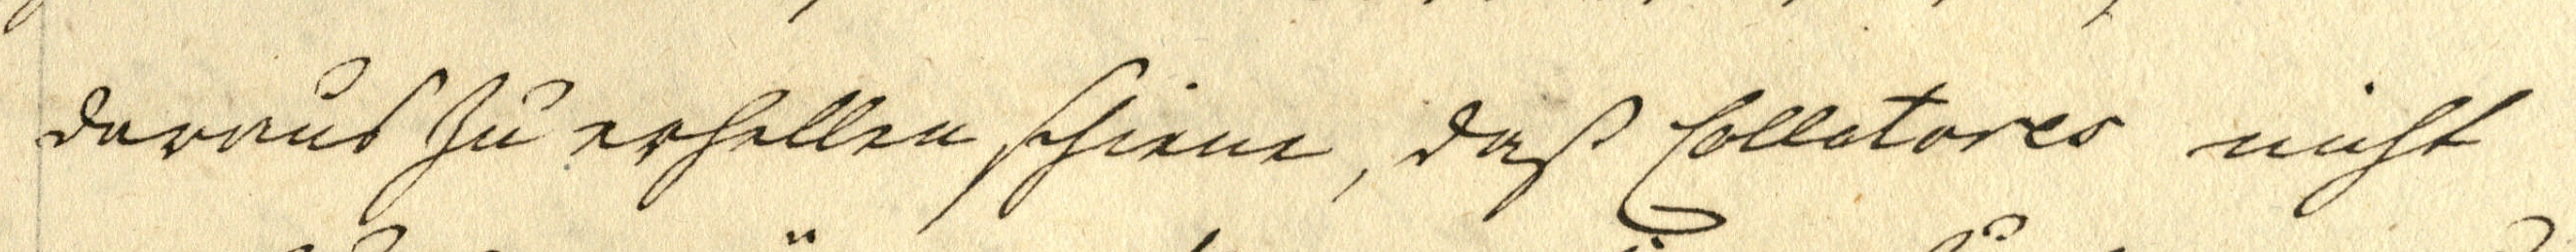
daraus zu erhellen schiene, daß Collatores nicht
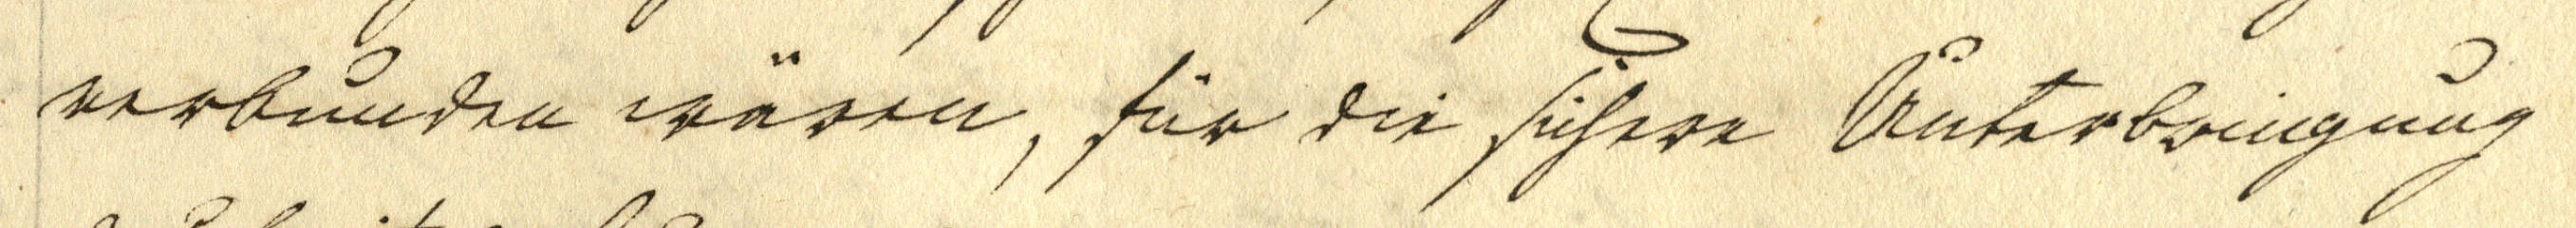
verbunden wären, für die sichere Unterbringung
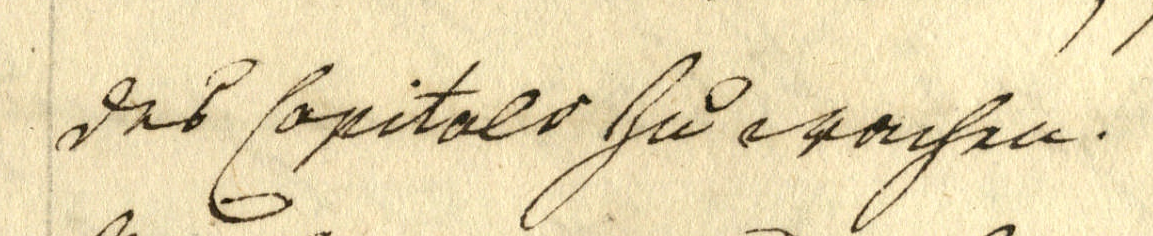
des Capitals zu wachen.
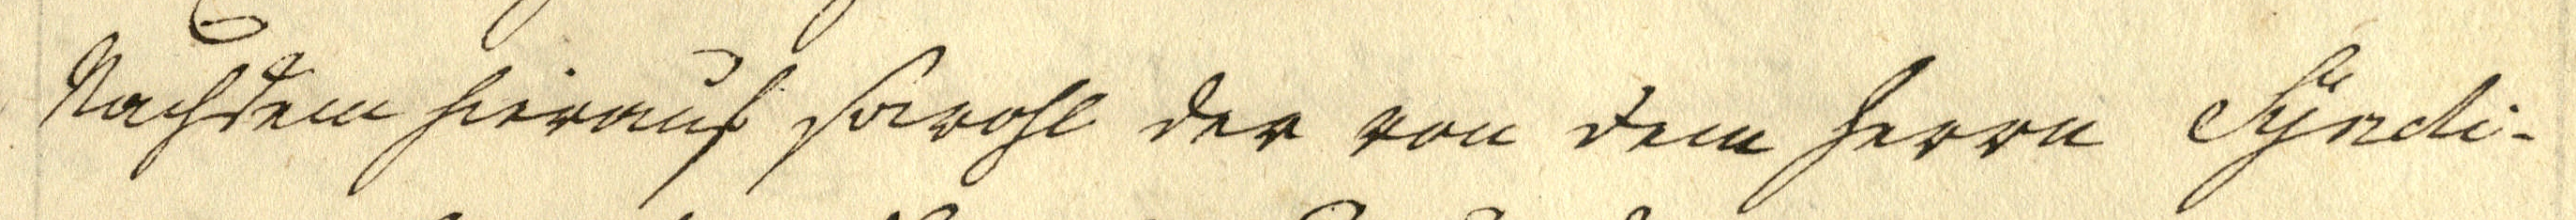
Nachdem hirauf sowohl der von dem Herrn Syndi-
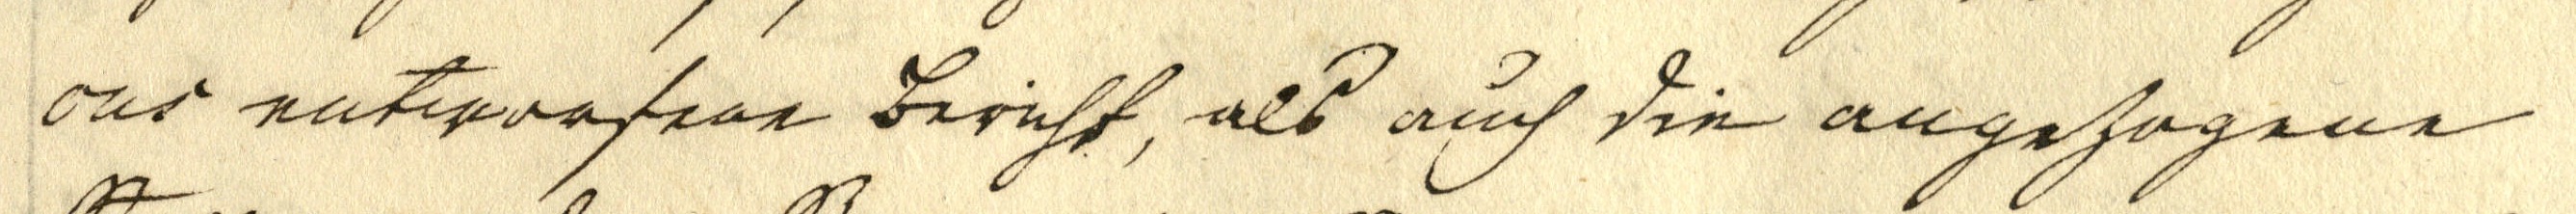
cus entworfene Bericht, als auch die angezogene
